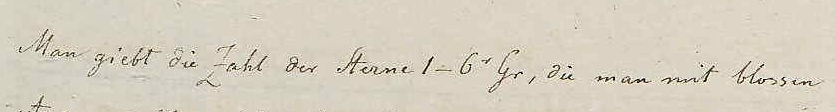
Man giebt die Zahl der Sterne 1–6￼ Gr, die man mit blossen
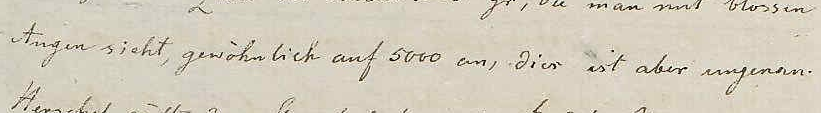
Augen sieht, gewöhnlich auf 5000 an, dies ist aber ungenau.
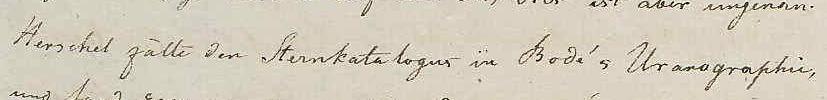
Herschel zälte den Sternkatalogus in Bode's Uranographie,
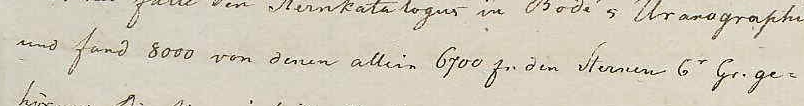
und fand 8000 von denen allein 6700 zu den Sternen 6￼ Gr. ge-
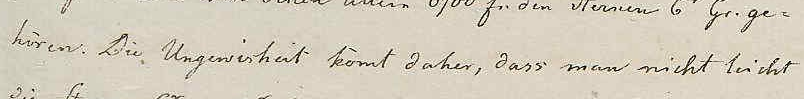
hören. Die Ungewisheit kömt daher, dass man nicht leicht
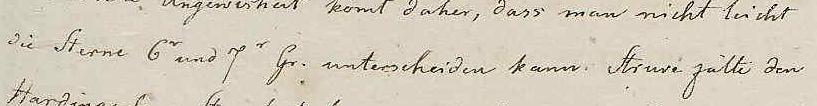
die Sterne 6￼ und 7￼ Gr. unterscheiden kann. Struve zälte den
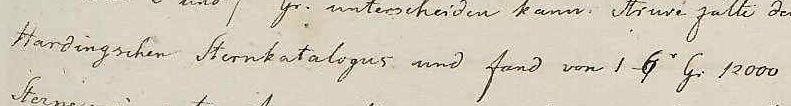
Hardingschen Sternkatalogus und fand von 1–76￼ Gr. 12000
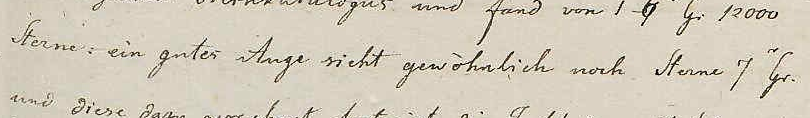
Sterne: ein gutes Auge sieht gewöhnlich noch Sterne 7￼ Gr.
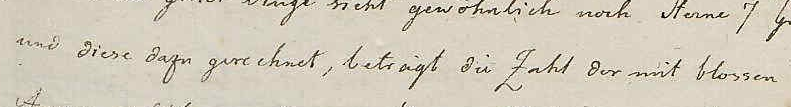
und diese dazu gerechnet, beträgt die Zahl der mit blossen
